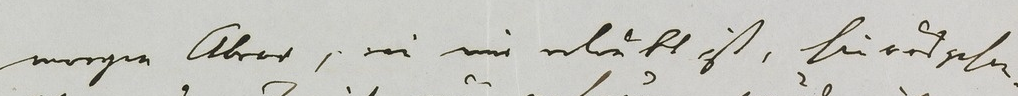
morgen Abend, wie mir erlaubt ist, hinausgehen.
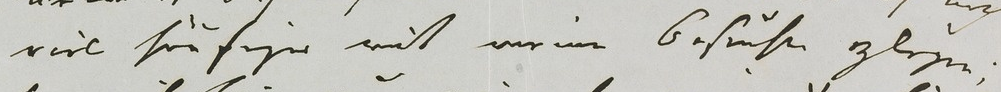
viel häufiger mit meinem Besuche plagen;
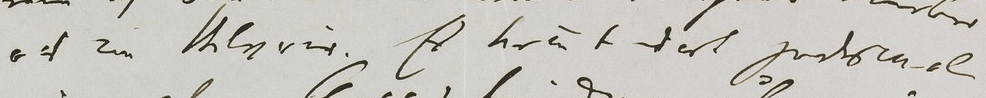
als im Belvoir. Es kommt dort jedesmal
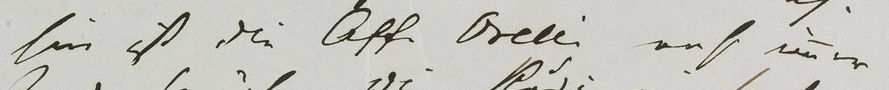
Hier ist die Aff. Orelli noch immer
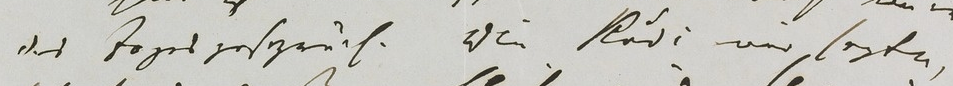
das Tagesgespräch. Wie Rudi mir sagte,
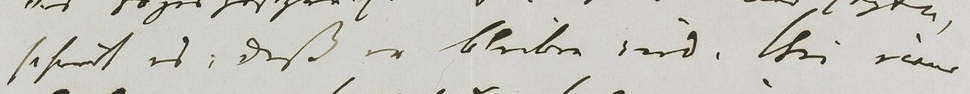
scheint es, daß er bleiben wird. Bei einer
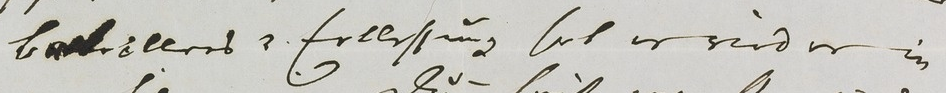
Bataillons-Entlassung hat er wieder in
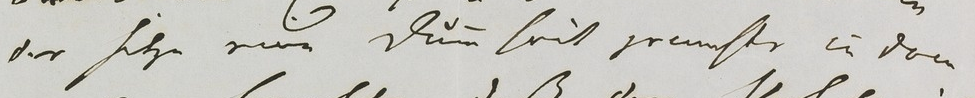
der Hitze eine Dummheit gemacht, indem
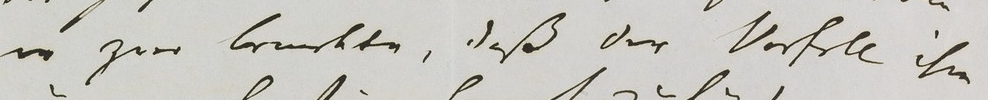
er zwar bemerkte, daß der Vorfall ihm
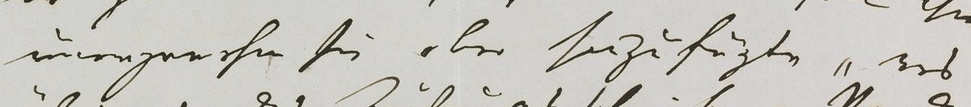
unangenehm sei aber hinzufügte «was
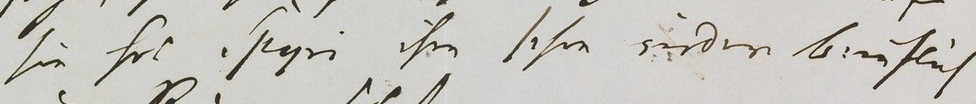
hin hat Spyri ihm schon wieder brieflich
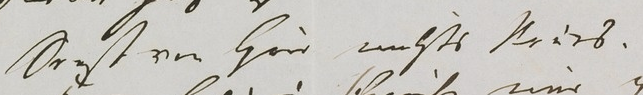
Sonst von hier nichts Neues.
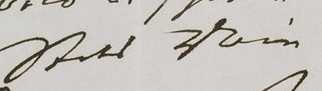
Stets dein
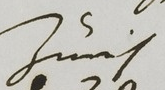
Zürich
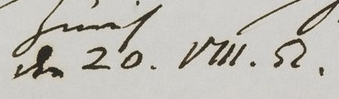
den 20. VIII. 52.
